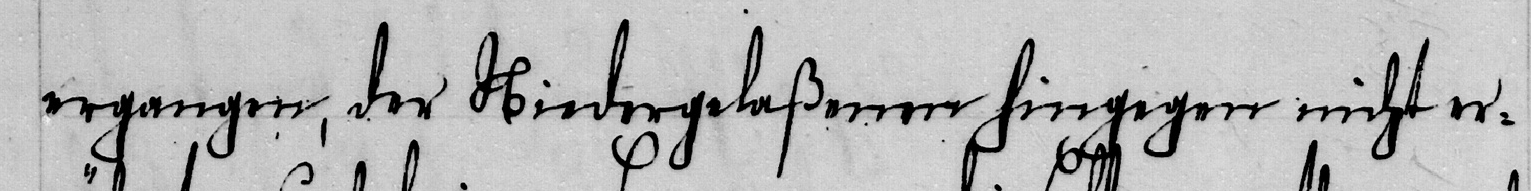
ergangen, der Niedergelaßenen hingegen nicht er¬
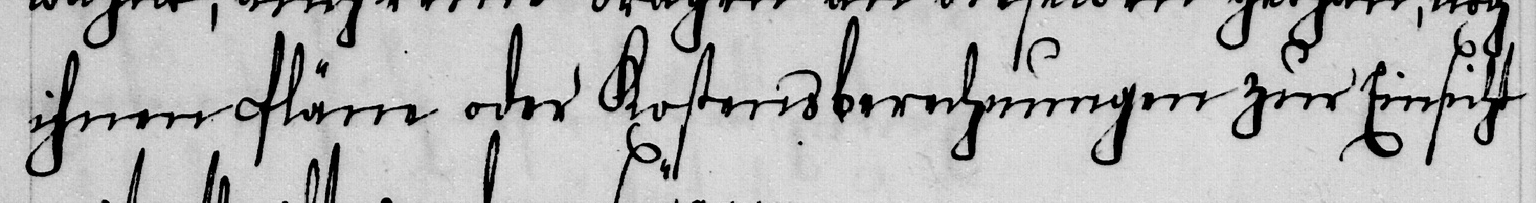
ihnen Pläne oder Kostenberechnungen zu Einsicht
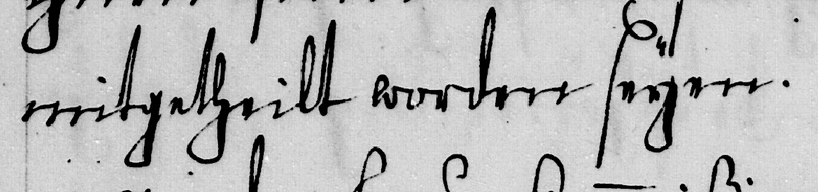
mitgetheilt worden seyen.
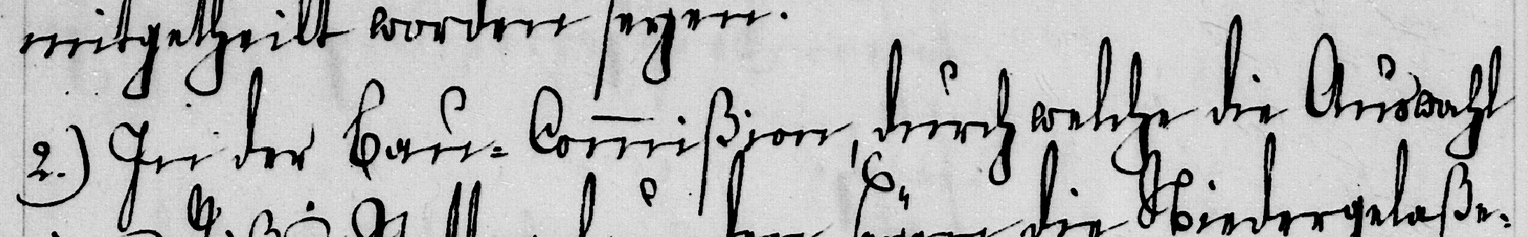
2.) In der Bau-Commißion, durch welche die Auswahl
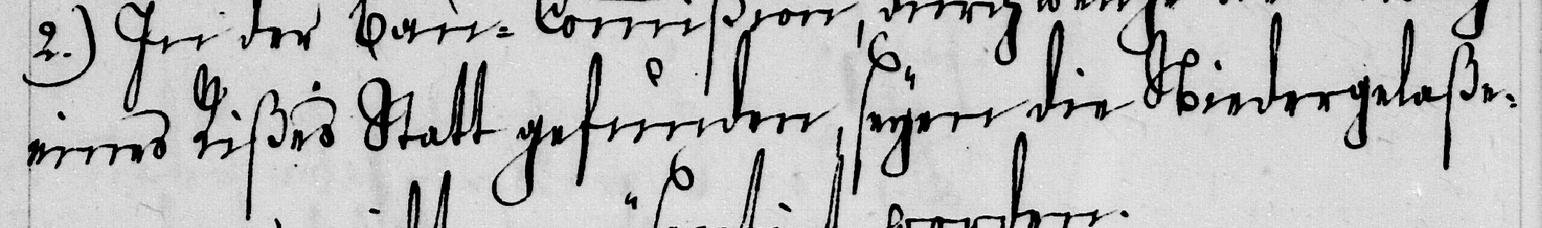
eines Rißes Statt gefunden, seyen die Niedergelaße¬
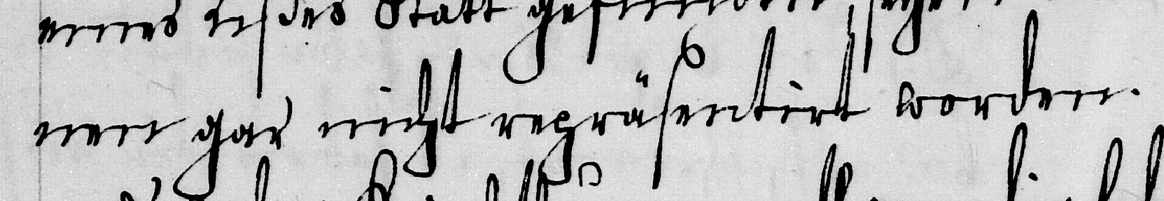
nen gar nicht repräsentiert worden.
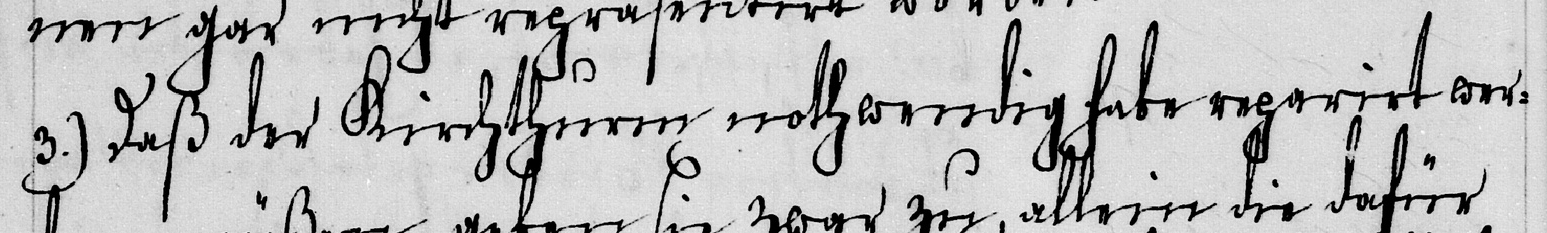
3.) Daß der Kirchthurm nothwendig habe reparirt wer¬
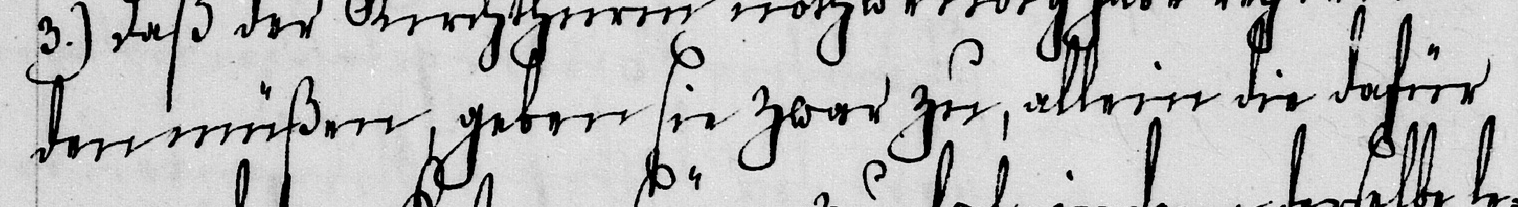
den müßen, gaben sie zwar zu, allein die dafür
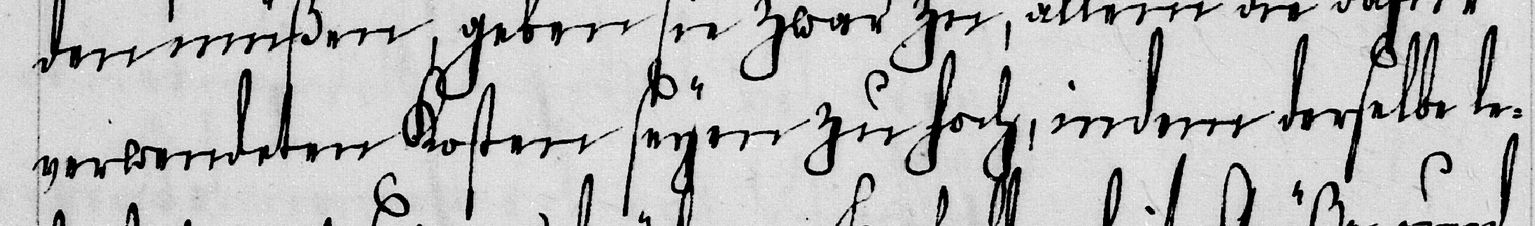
verwendeten Kosten seyen zu hoch, indem derselbe
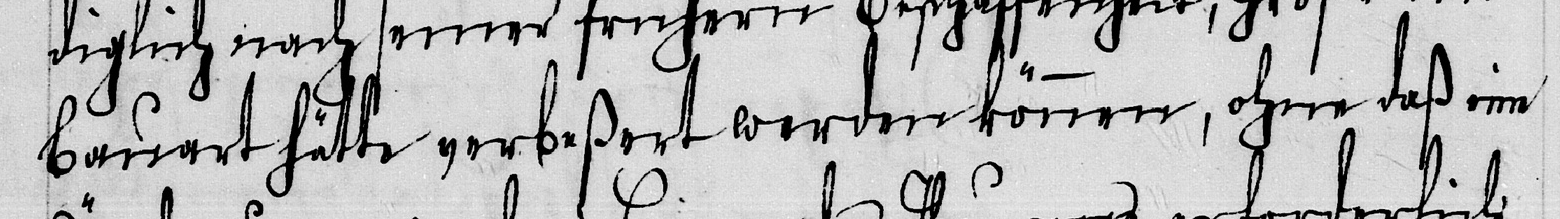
Bauart hätte verbeßert werden können, ohne daß eine
